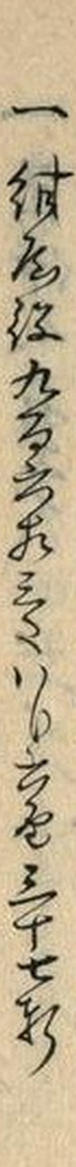一紺屋役九百六拾三匁八分六厘三十七軒
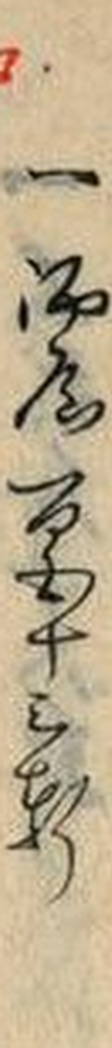一酒屋百五十三軒

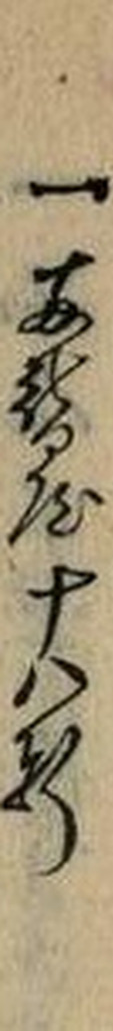一両替屋十八軒
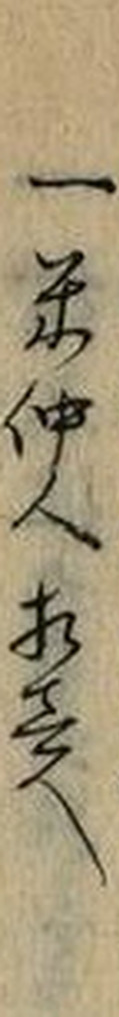一米仲人拾壱人
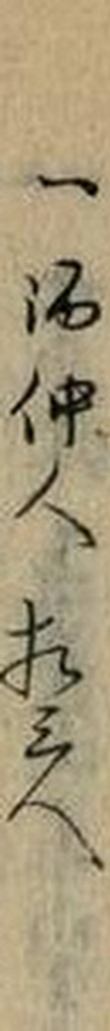一酒仲人拾三人
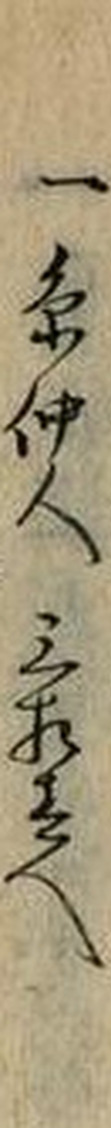一糸仲人三拾壱人
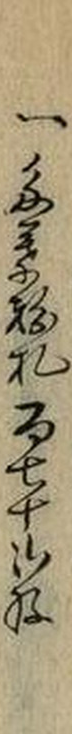一多葉粉札百七十弐枚
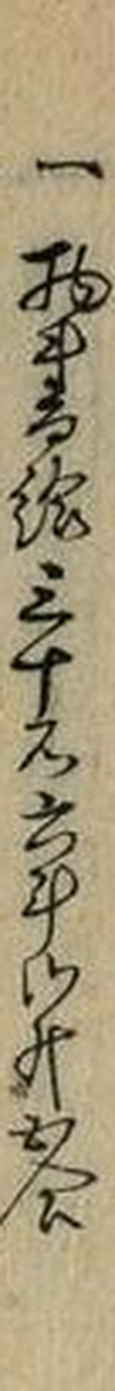一物書絵三十石六斗弐升五合
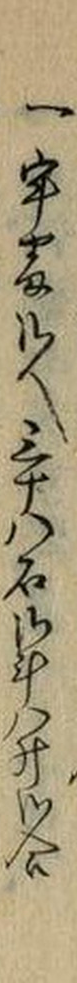一牢番弐人三十八石弐斗八升弐合
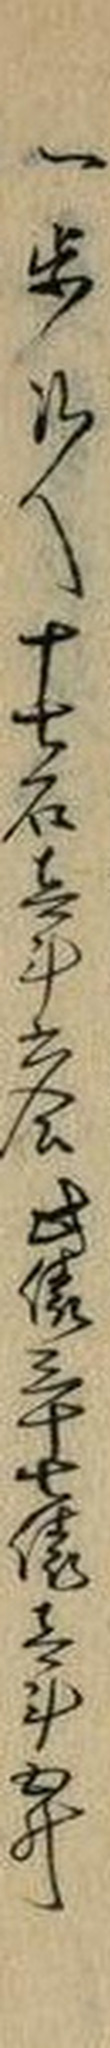一歩弐人十七石壱斗六合此俵三十七俵壱斗五升
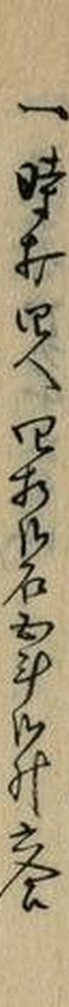一時打四人四拾弐石五斗弐升六合
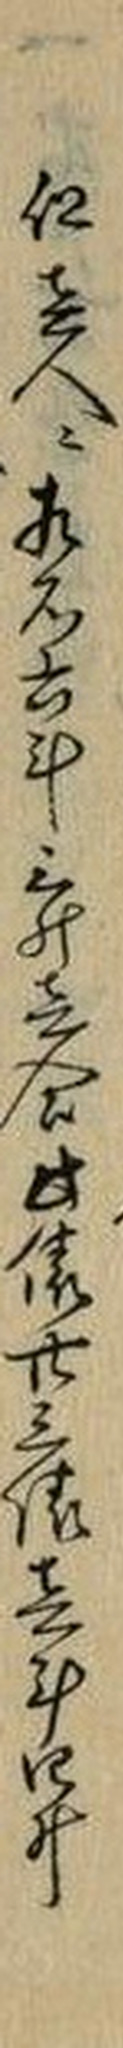但壱人ニ拾石六斗三升壱合此俵廿三俵壱斗四升
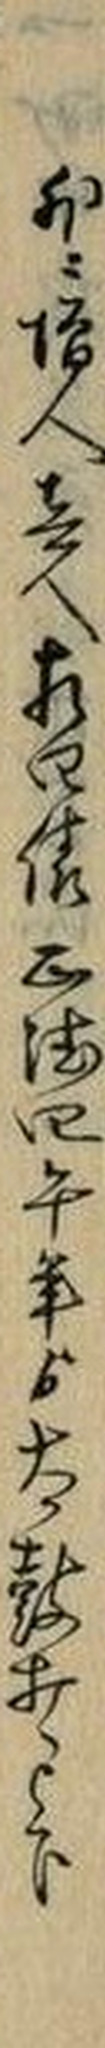卯ニ増人壱人拾四俵正徳四午年ゟ太鼓打へ被下
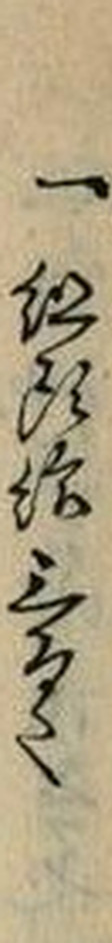一組頭給三百匁
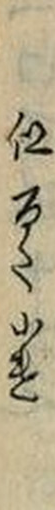但百匁小遣
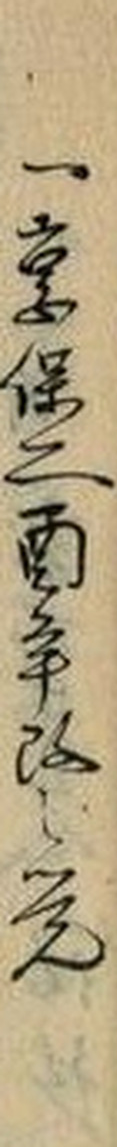一享保二酉年改之覚
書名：御国他国諸事之部
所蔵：福井県文書館 Fukui Prefectural Archives
